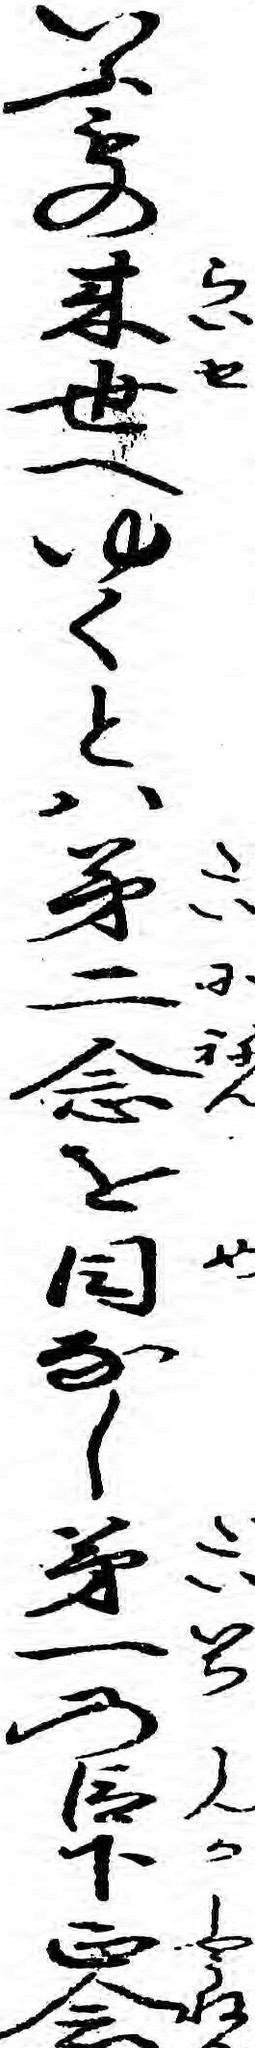いふもの来世へゆくとは第二念を目なし第一の臣下正念

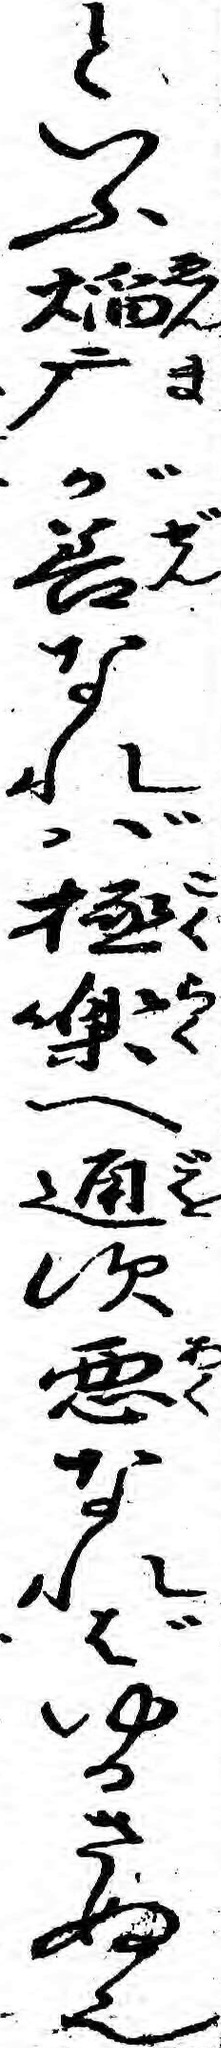といふ焔魔が善なれば極楽へ通す悪なればゆるさぬ也。
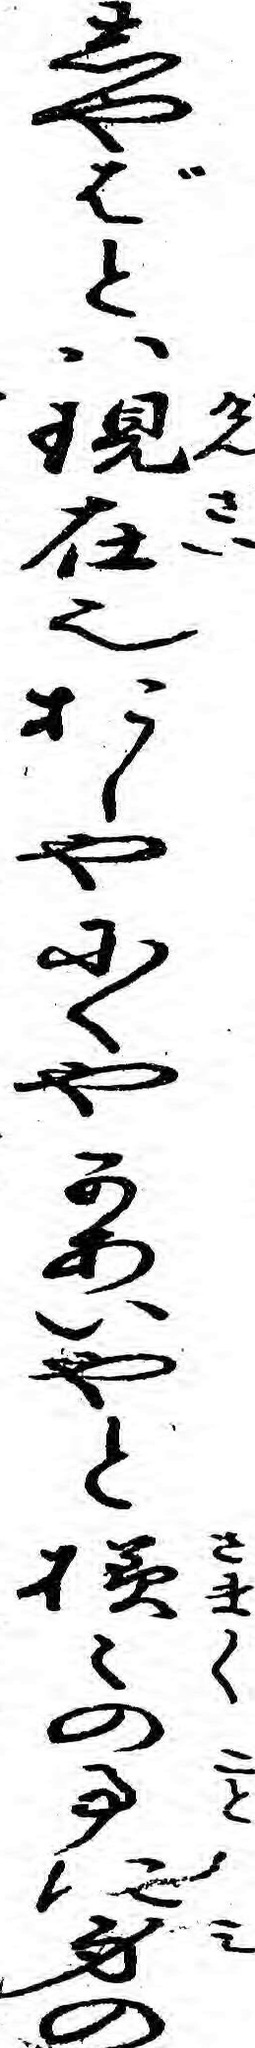しやばとは現在也おしやにくやかあいやと様々の事に身の
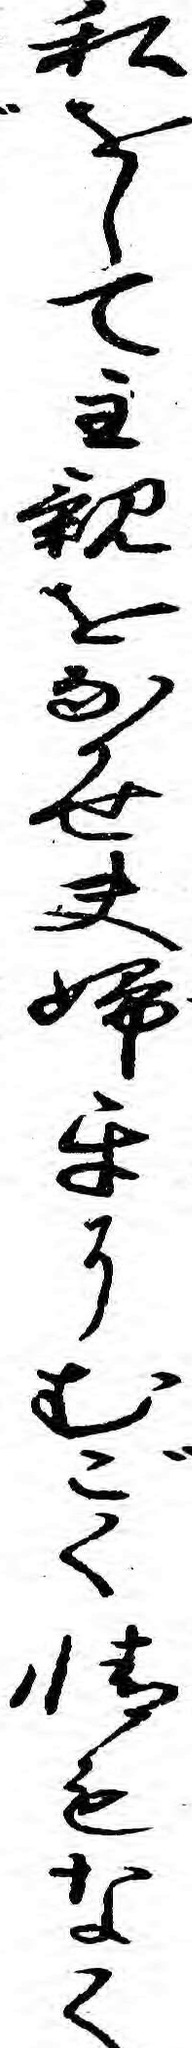私をして主親をなかせ夫婦互にむごく情もなく
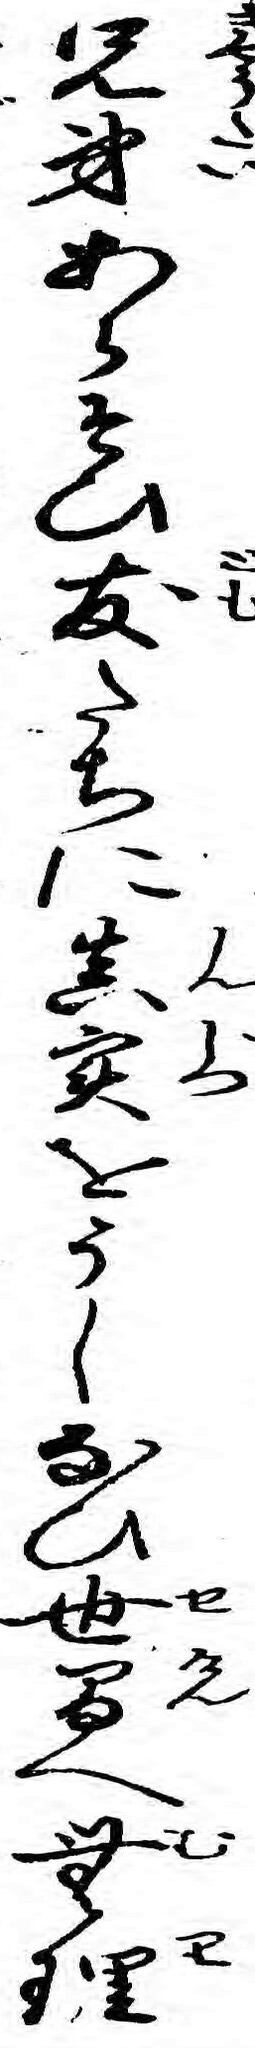兄弟あらそひ友たちに真実をうしなひ世間へ無理
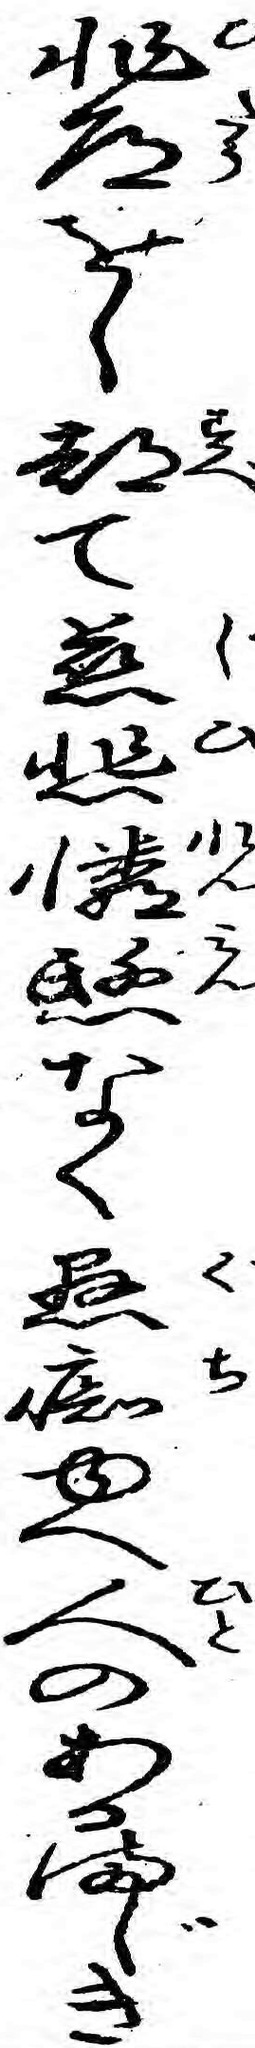非道をし都て慈悲憐愍なく愚痴ゆへ人のあるまじき
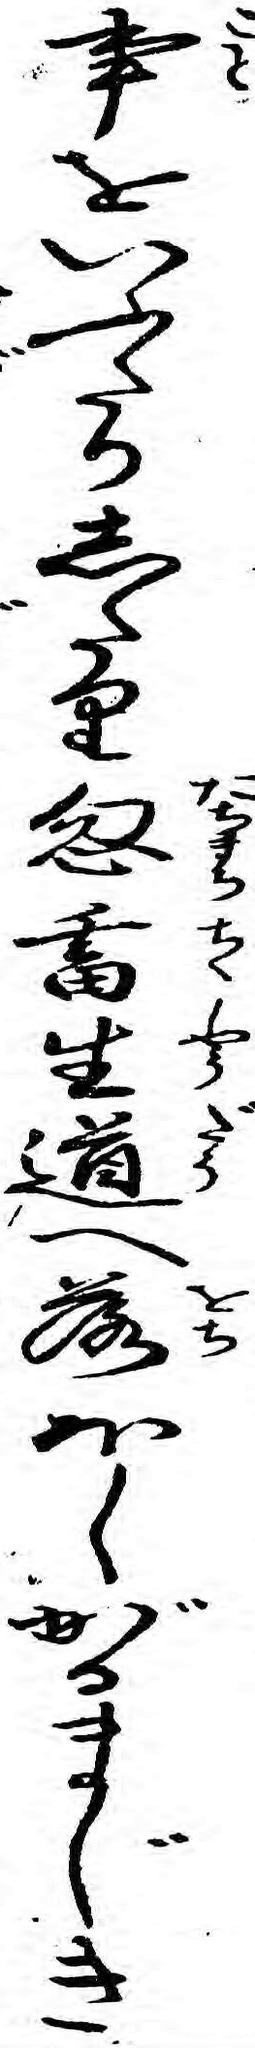事をいふたりしたり忽畜生道へ落ほしがるまじき
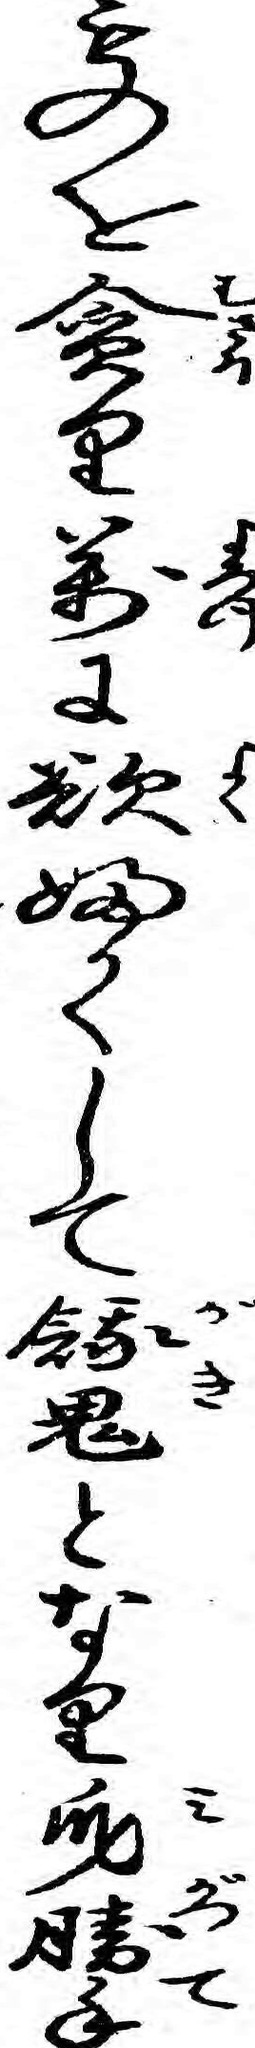ものを貪り万に欲ふかくして餓鬼となり身勝手
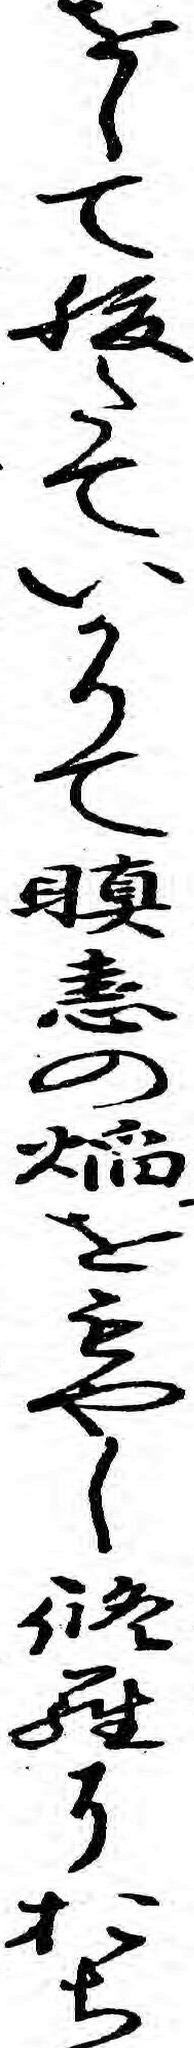をして腹たていかりて瞋恚の焔をもやし修羅におち
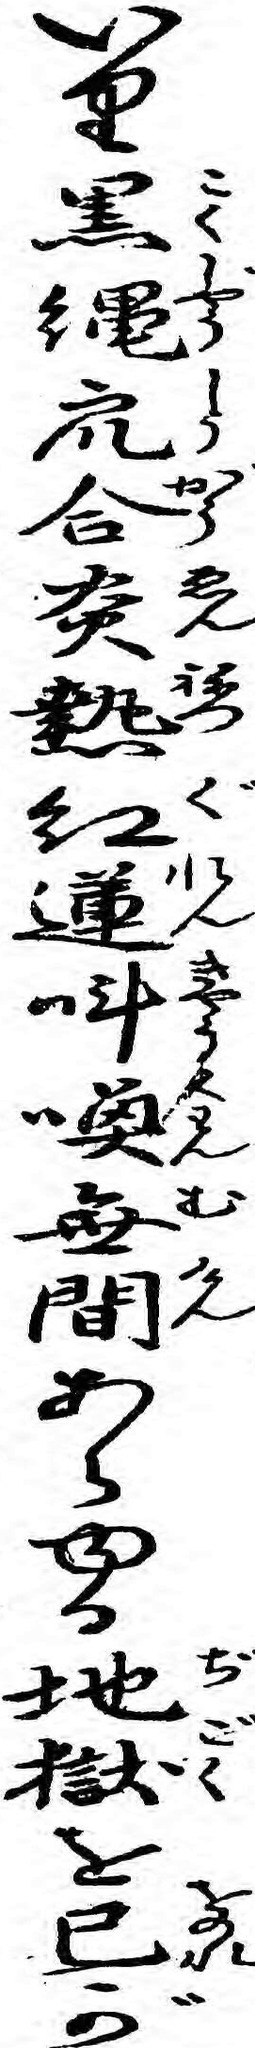いり黒縄衆合炎熱紅蓮叫喚無間あらゆる地獄を己が
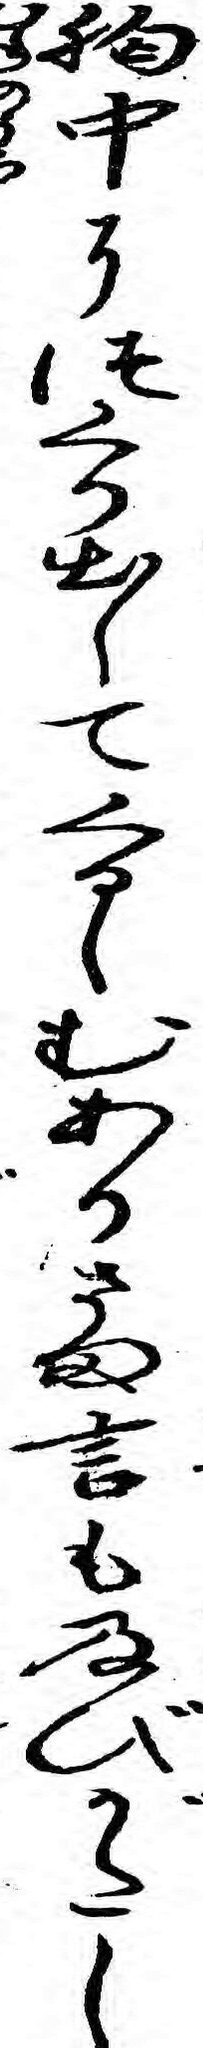胸中につくり出してくるしむありさま言も及びがたし
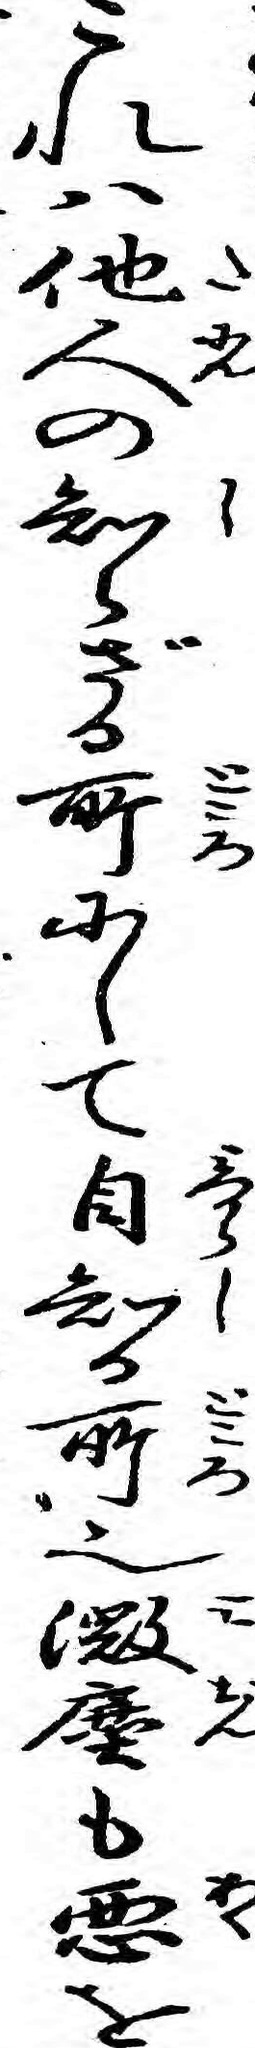これは他人の知らざる所にして自知る所也微塵も悪を
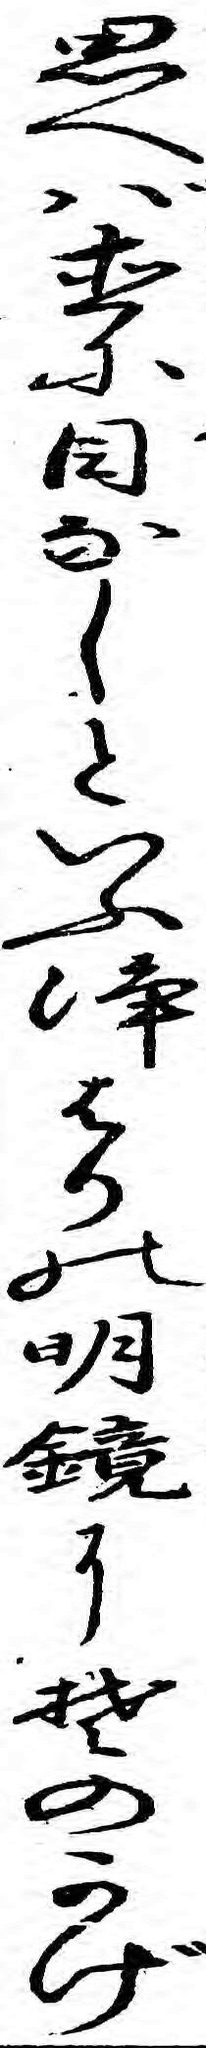思へば直に目なしといふ浄はりの明鏡にそのかげ
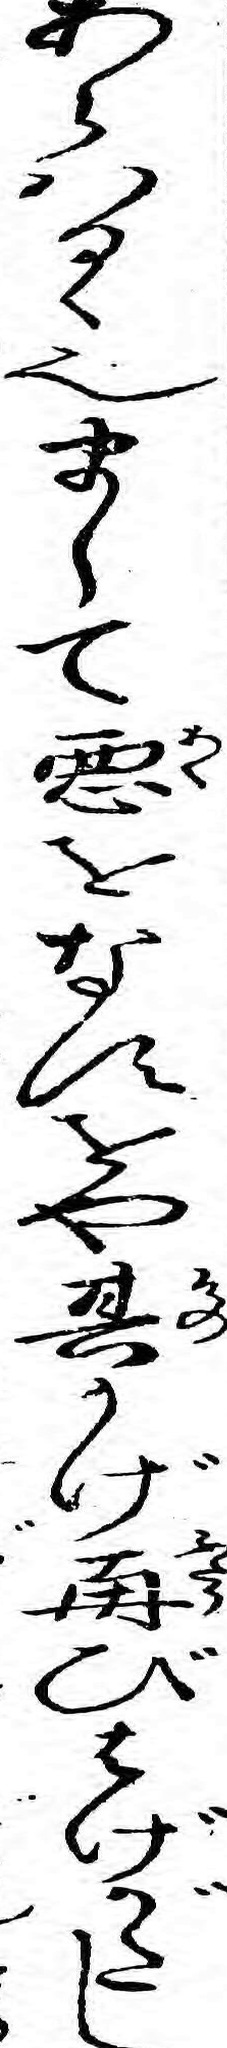あらはるゝ也まして悪をなすをや其かげ再びはげがたし
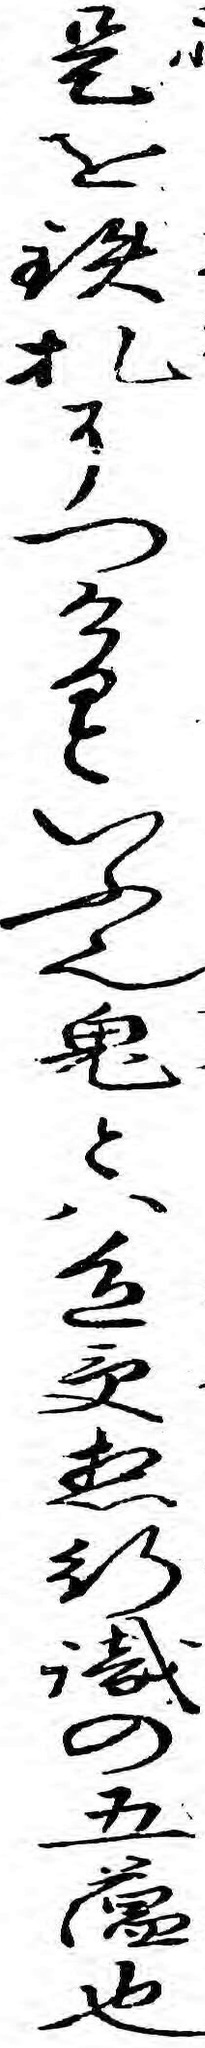是を鉄札につけるといふ也鬼とは色受想行識の五蘊也
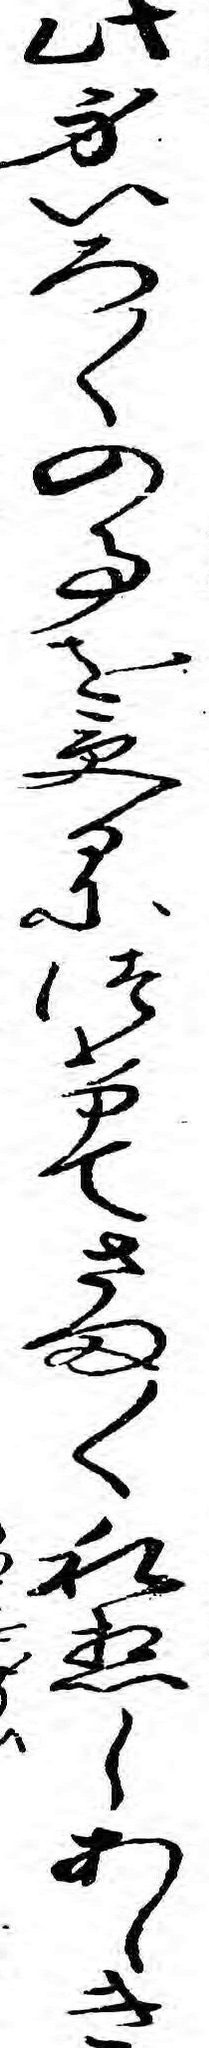此身いろ〳〵の事を受るにつけてさま〳〵私想しあしき
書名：目なし用心抄
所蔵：国文学研究資料館
